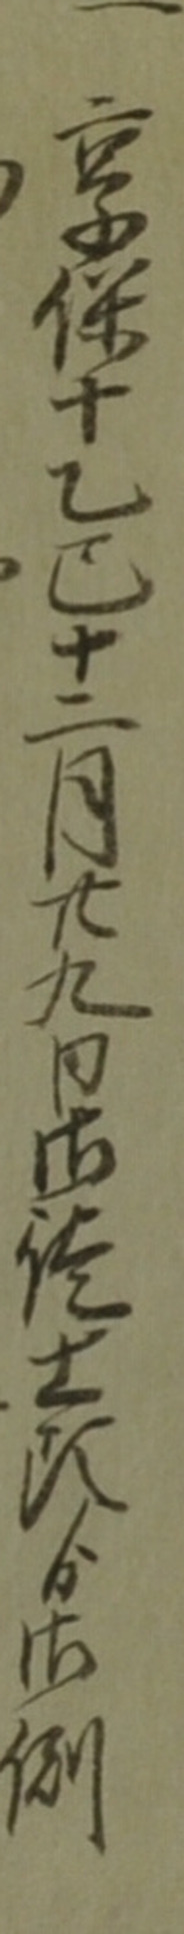一享保十乙巳十二月廿九日御徒士頭ゟ御側
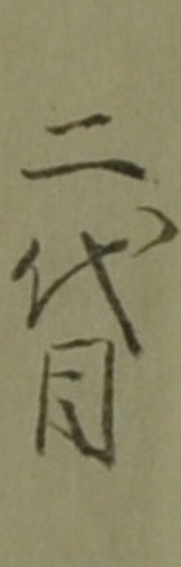二代目
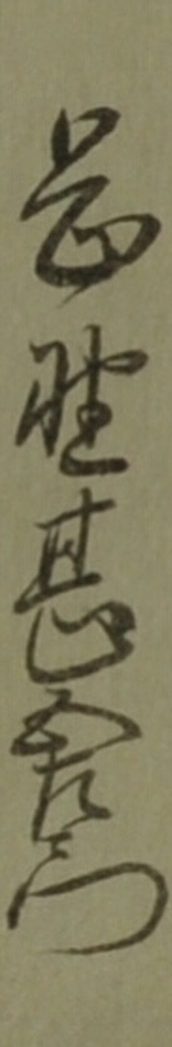岡野甚五左衛門
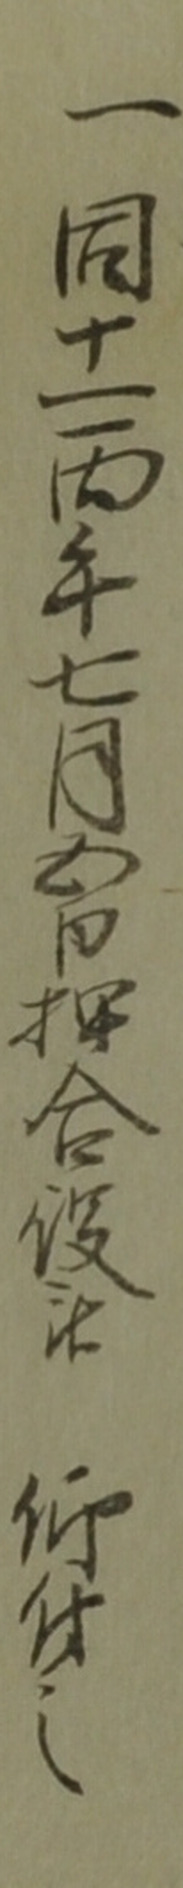一同十一丙午七月五日押合役被仰付之
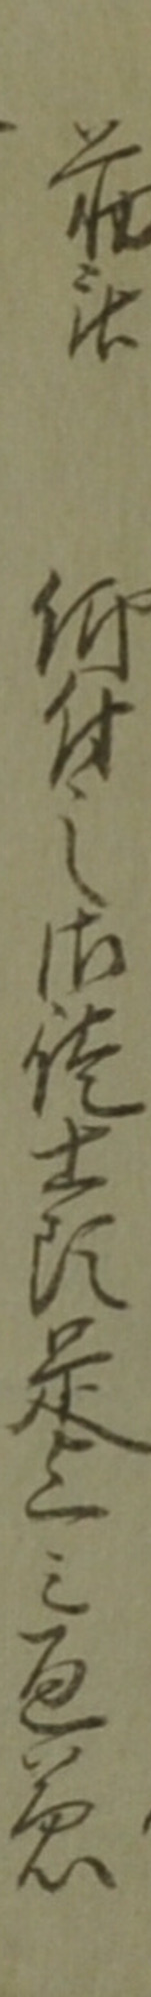勤被仰付之御徒士頭是迄之通兼
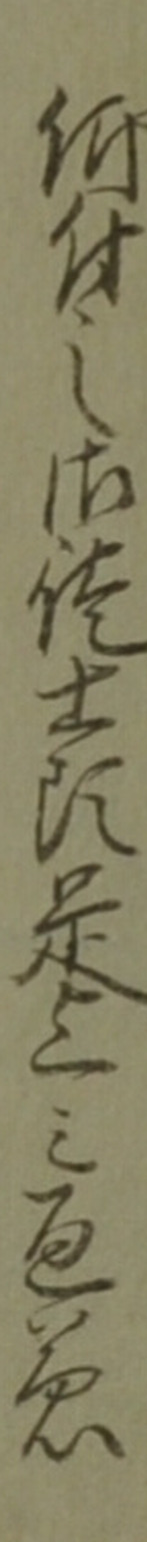勤被仰付之御徒士頭是迄之通兼
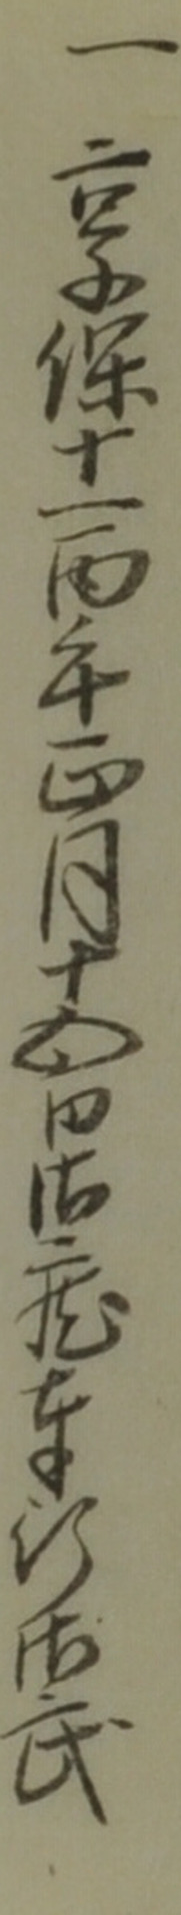一享保十一丙午正月十五日御蔵奉行御武
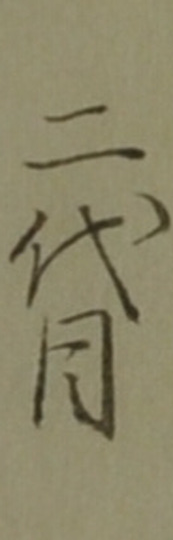二代目
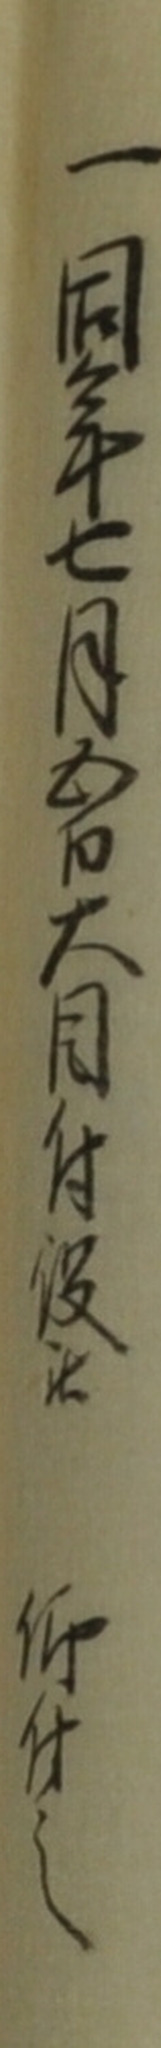一同年七月五日大目付役被仰付之
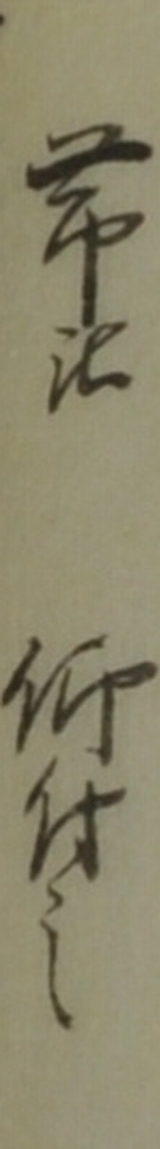帯被仰付之
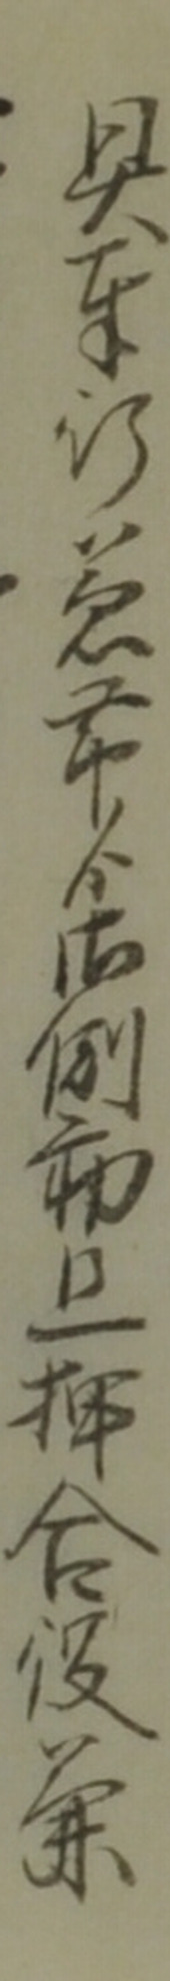具奉行兼帯ゟ御側勤且押合役兼
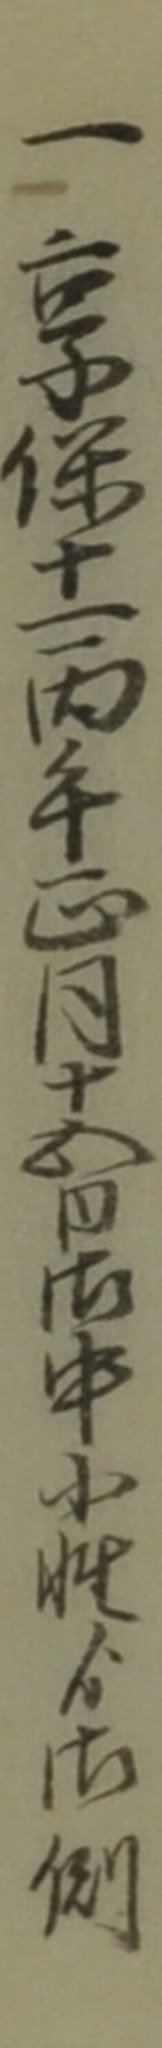一享保十一丙午正月十五日御中小性ゟ御側
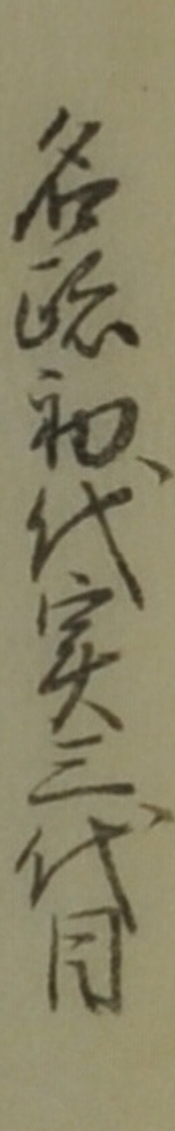名跡初代実三代
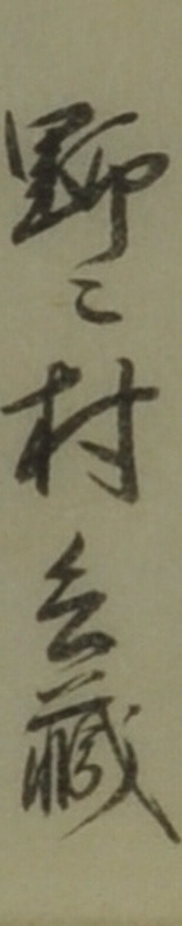野々村兵蔵
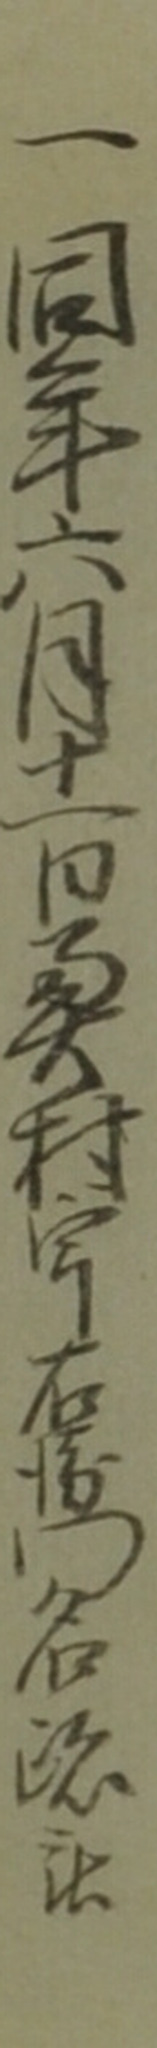一同年六月十一日奥村宇右衛門名跡被
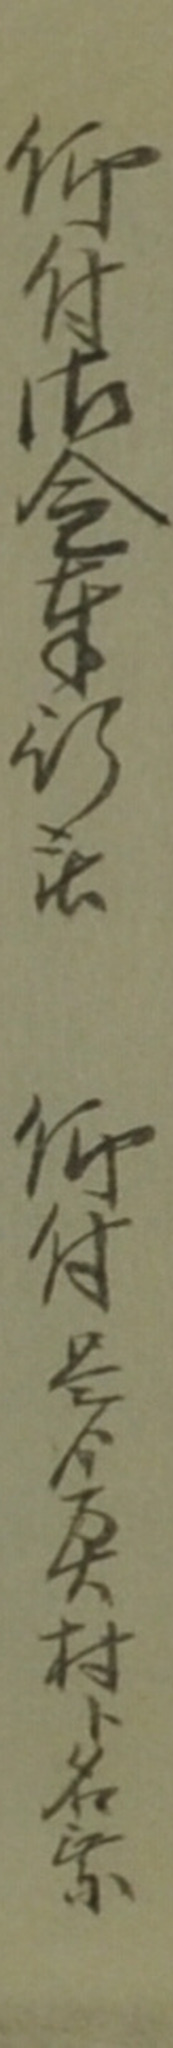仰付御金奉行被仰付是ゟ奥村ト名乗
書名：諸御役代々録（五）
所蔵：伊那市立高遠町図書館・合同会社AMANE
